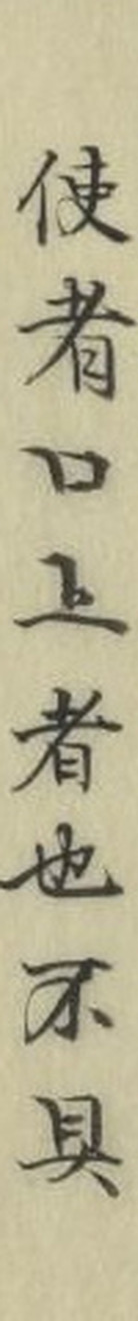使者口上者也不具
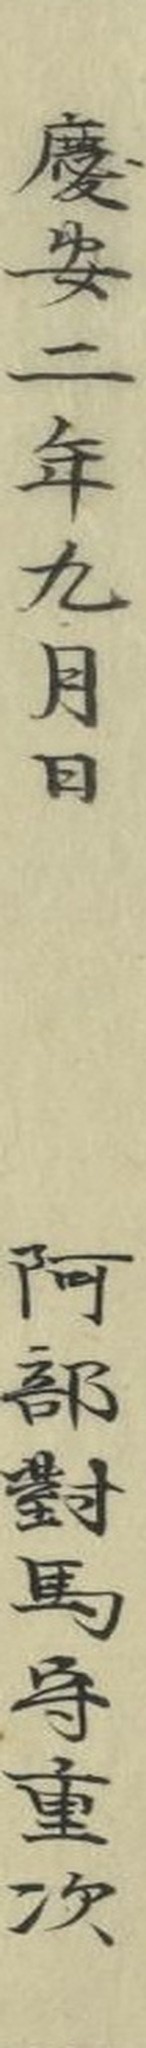慶安二年九月日阿部對馬守重次
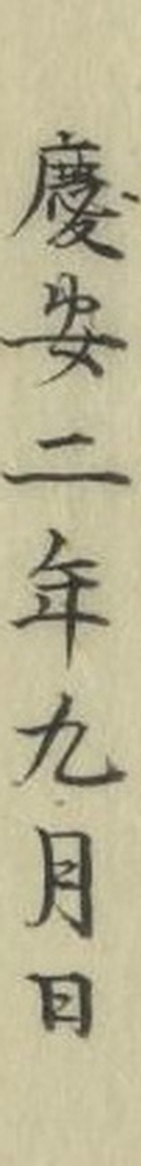慶安二年九月日
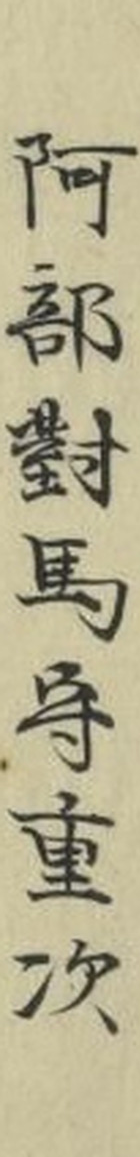阿部對馬守重次
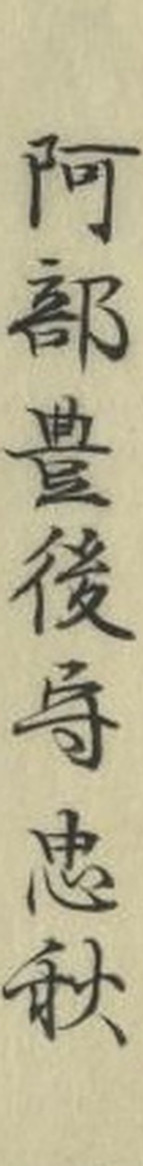阿部豊後守忠秋
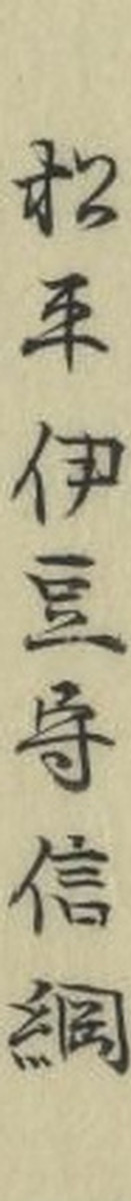松平伊豆守信綱
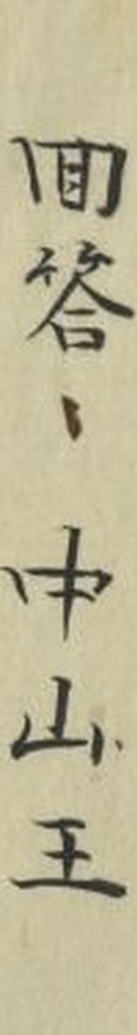回答中山王
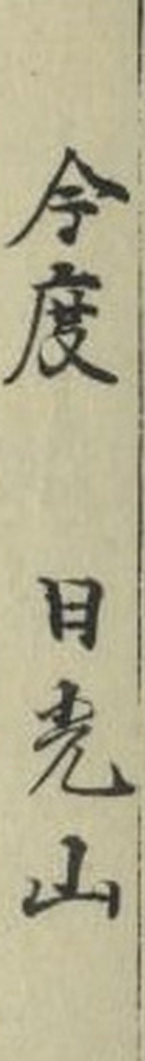今度日光山
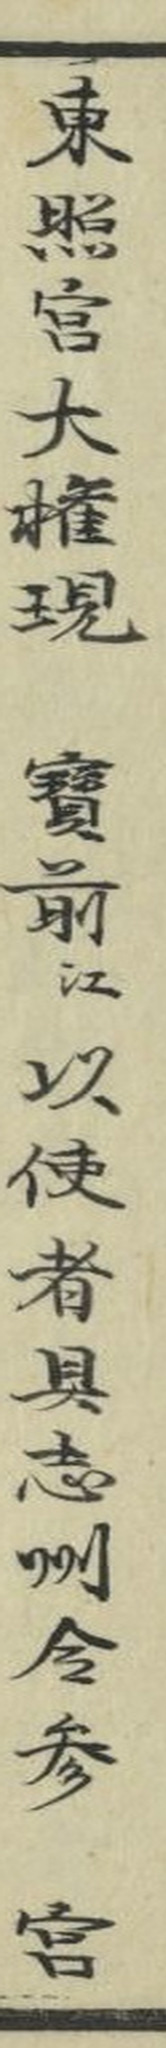東照宮大権現宝前え以使者具志州令参宮
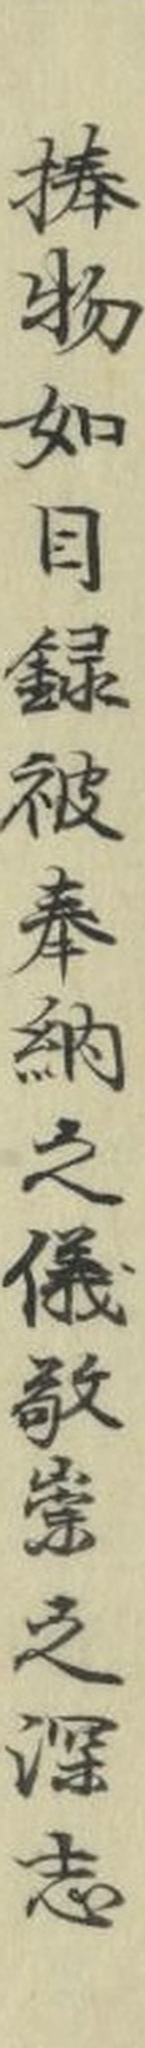捧物如目録被奉納之儀敬崇之深志
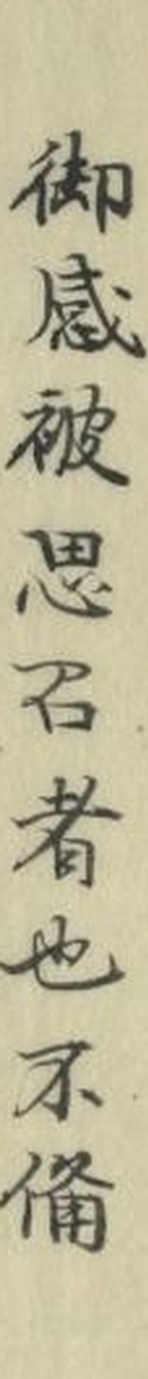御感被思召者也不備
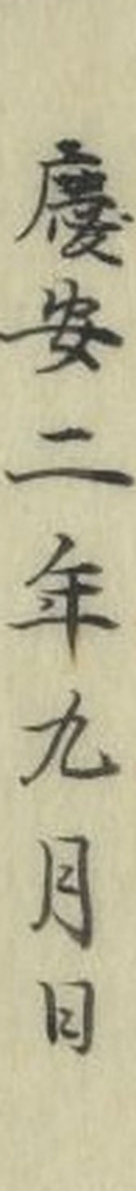慶安二年九月日
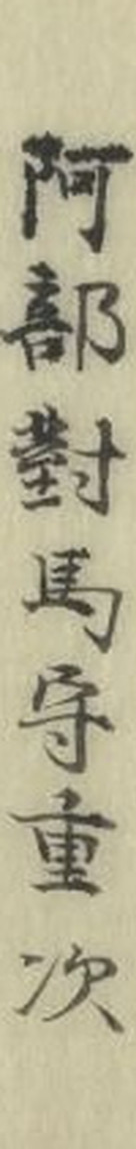阿部對馬守重次
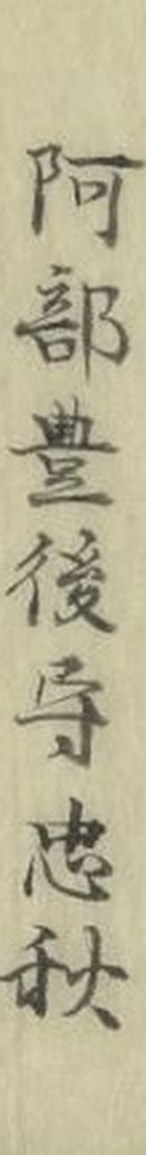阿部豊後守忠秋
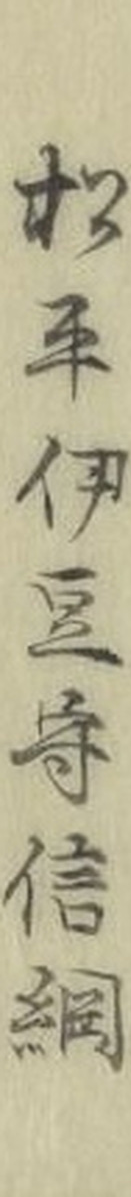松平伊豆守信綱
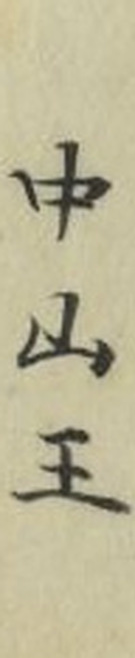中山王
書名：琉球往来（上）
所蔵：University of the Ryukyus Library
